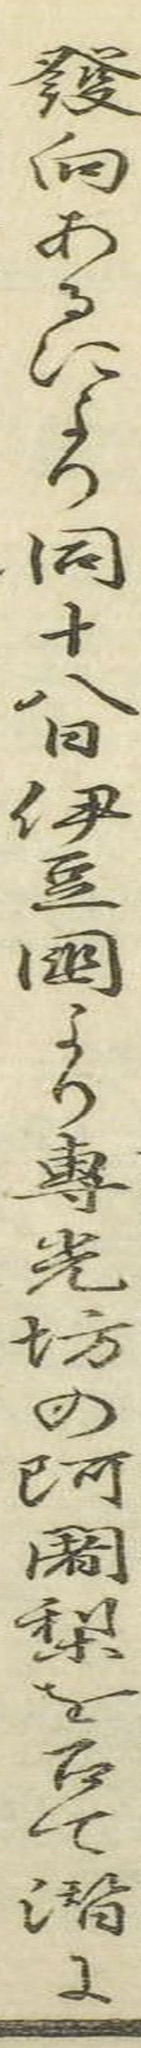発向あるにより同十八日伊豆国より専光坊の阿闍梨を召て潜に
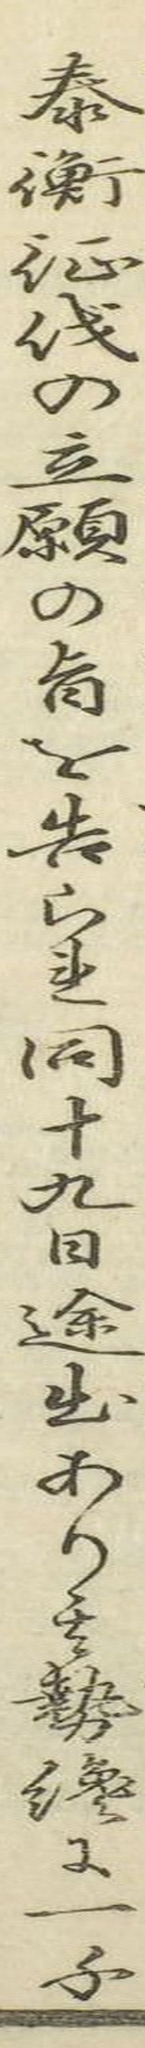泰衡征伐の立願の旨を告られ同十九日途出あり其勢纔に一千
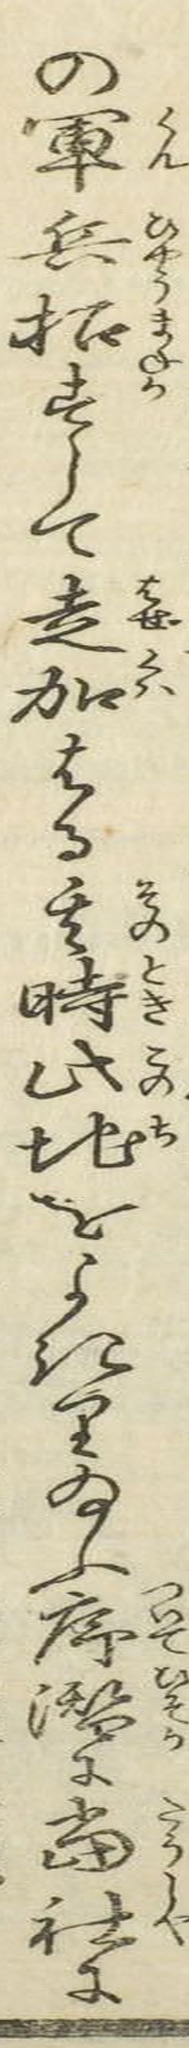の軍兵招すして走加はる其時此地をよきり給ふ序潜に当社に
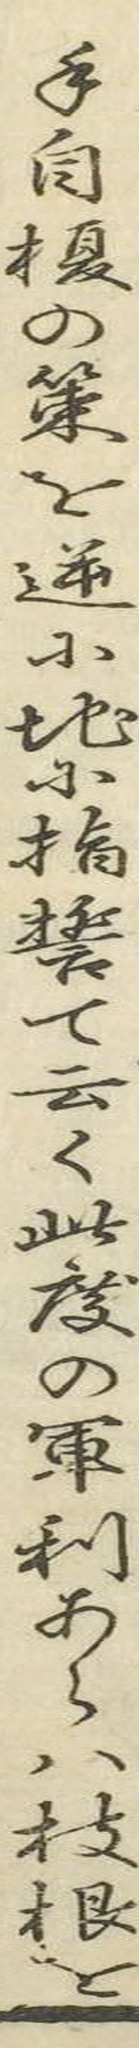手自榎の策を逆に地に指誓て云く此度の軍利あらは枝根を
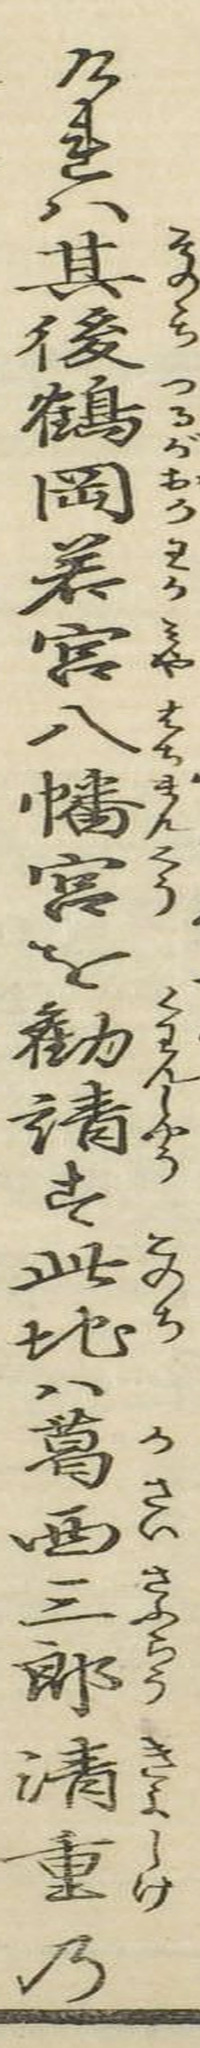けれは其後鶴岡若宮八幡宮を勧請す此地は葛西三郎清重の
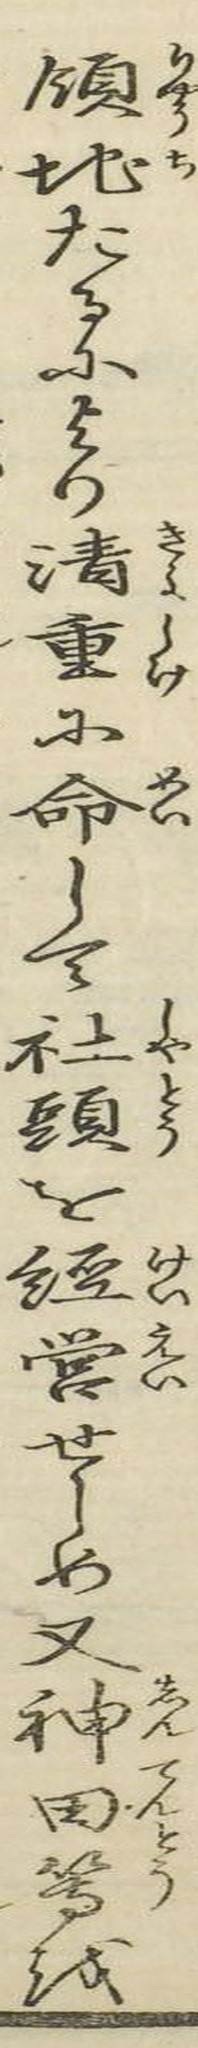領地たるにより清重に命して社頭を経営せしめ又神田等を
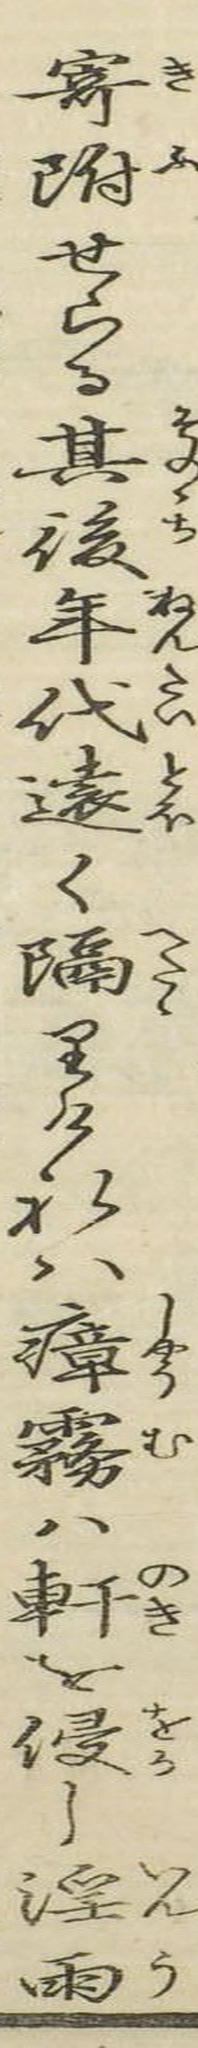寄付せらる其後年代遠く隔りけれは瘴霧は軒を侵し淫雨
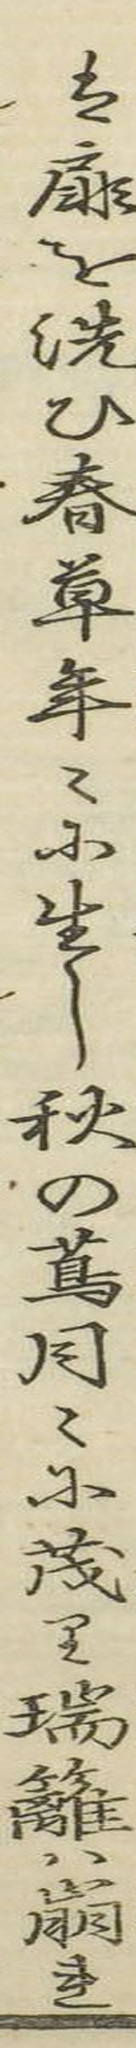は扉を洗ひ春草年々に生し秋の蔦月々に茂り瑞籬は崩れ
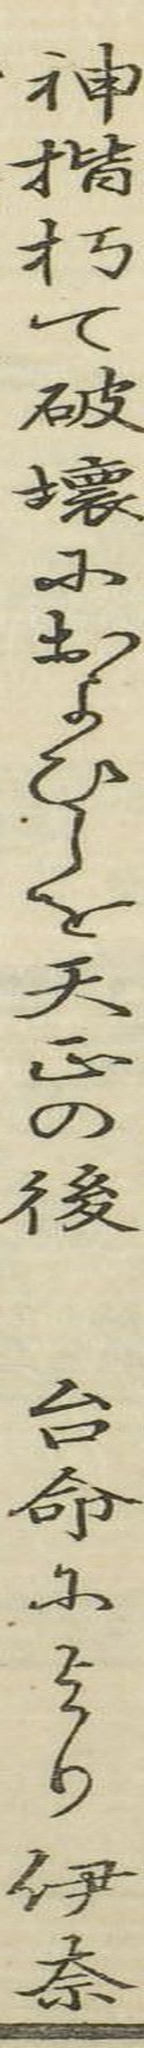神階朽て破壊におよひしを天正の後台命により伊奈
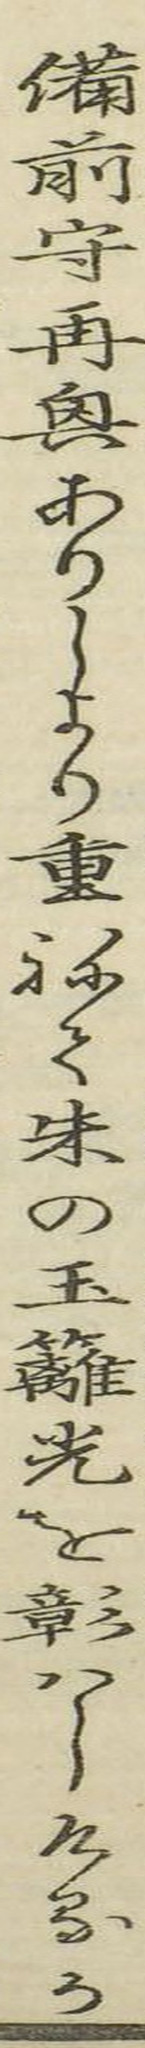備前守再興ありしより重ねて朱の玉籬光を彰はしけるか
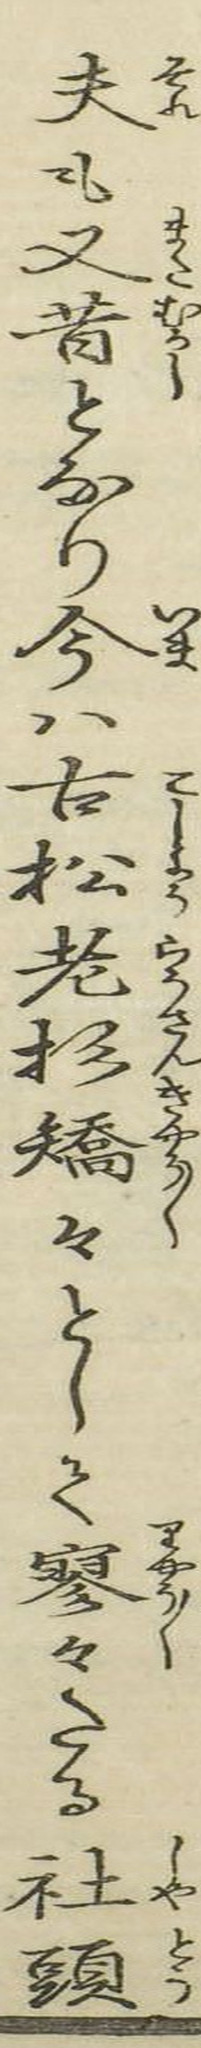夫も又昔となり今は古松老杉矯々として寥々たる社頭
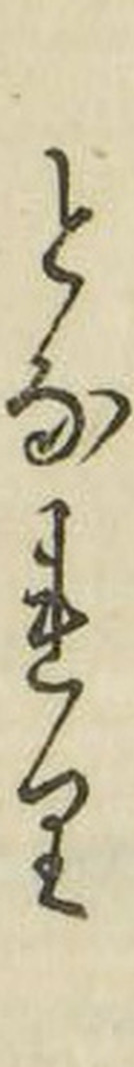となれり

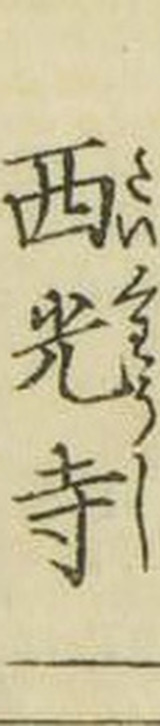西光寺
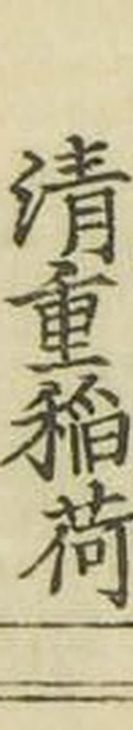清重稲荷

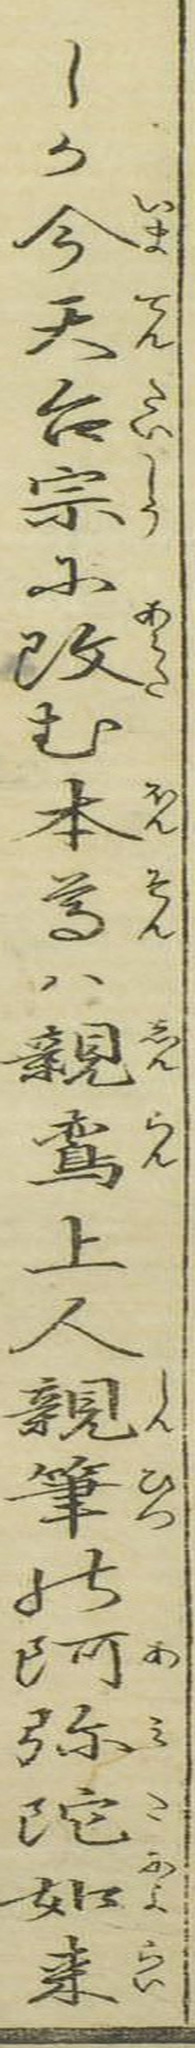しか今天台宗に改む本尊は親鸞上人親筆の阿弥陀如来
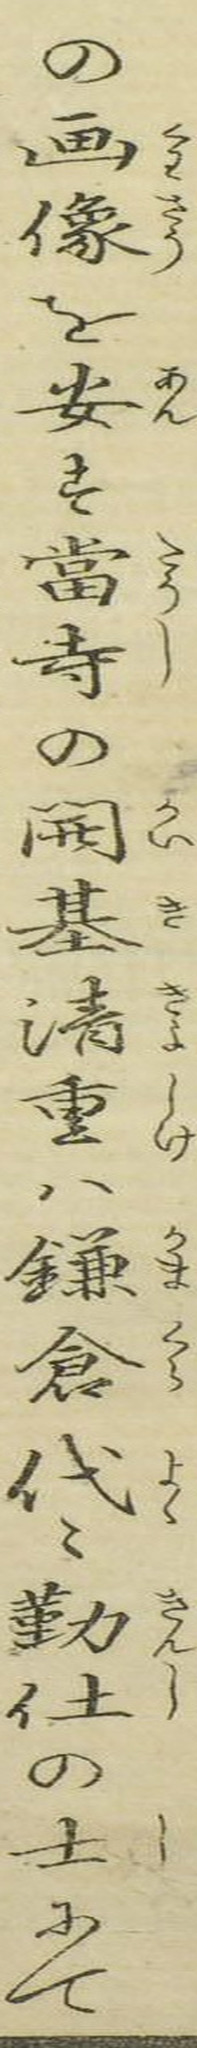の画像を安す当寺の開基清重は鎌倉代々勤仕の士にて
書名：江戸名所図会 20巻 巻之19
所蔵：東京学芸大学教育コンテンツアーカイブ
